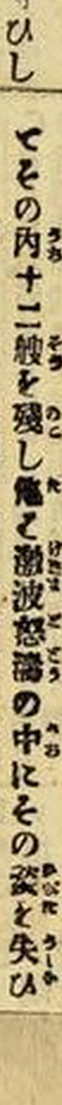てその内十二艘を殘し他は激波怒濤の中にその姿を失ひ
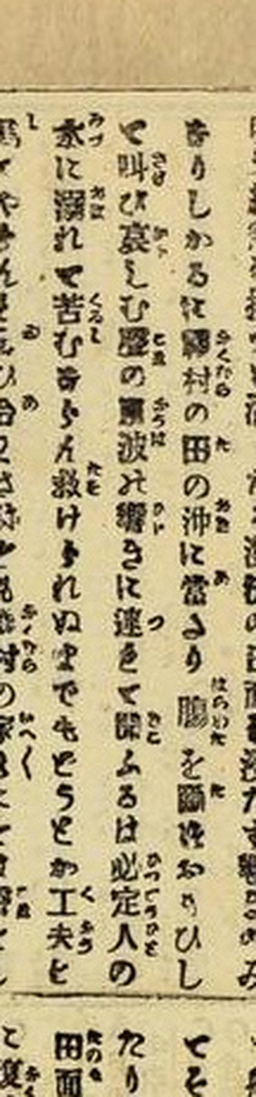て叫び哀しむ聲の風波の響きに連れて聞ふるは必定人の
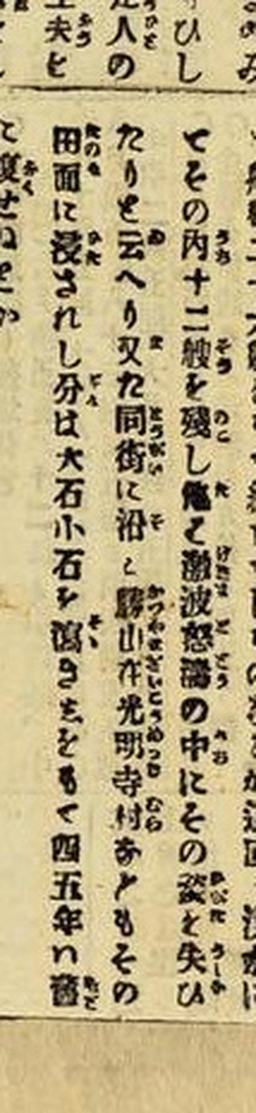たりと云へり又た同街に沿勝山在光明寺村なともその
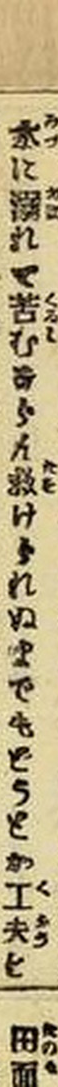水に溺れて苦むならん救けられぬまでもどうとか工夫を
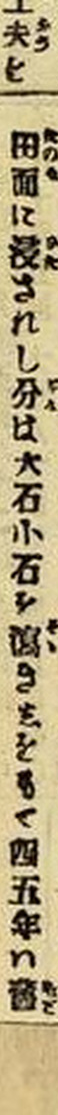田面も浸されし分は大石小石を瀉きしをもて四五年は舊
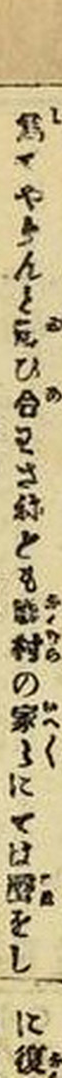爲てやらんと云ひ合わさねとも福村の家々にては聲をし
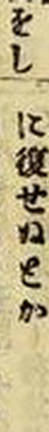に復せぬとか
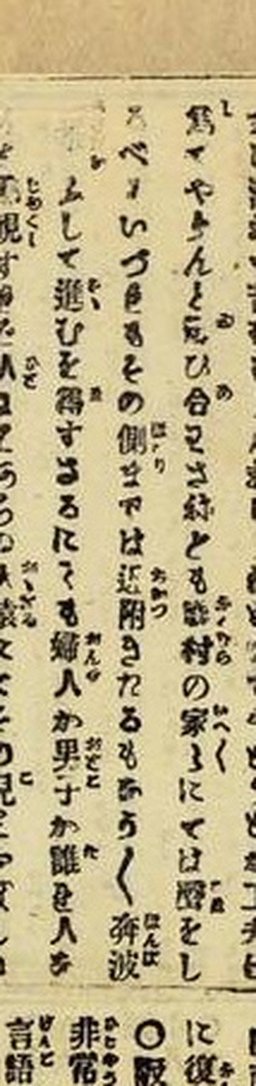るべきいづれもその側までは近附きたるもなか〳〵奔波
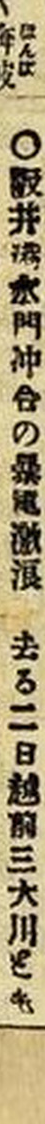○福井港水門沖合の暴風激浪去る二日越前三大川とも
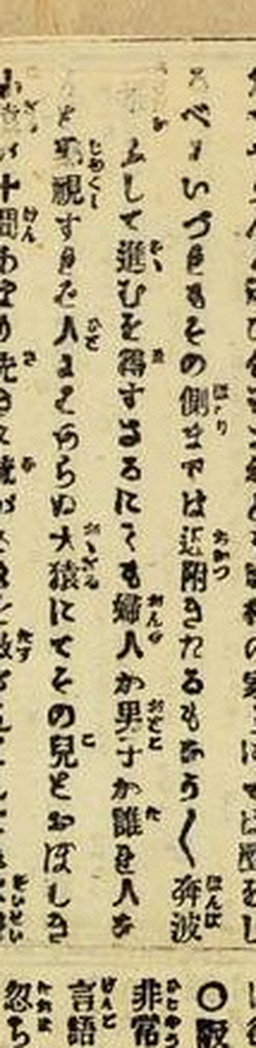ふして進むを得すさるにても婦人か男子か誰れ人な
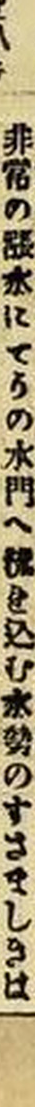非常の漲水にてかの水門へ流れ込む水勢のすさましきは
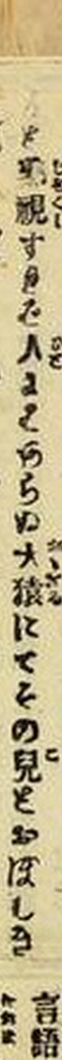と熟視すれば人にはあらぬ大猿にてその兒とおぼしき
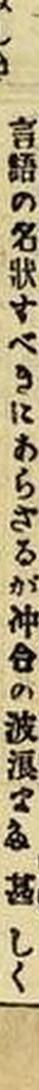言語の名狀すべきにあらざるが沖合の波浪また甚しく
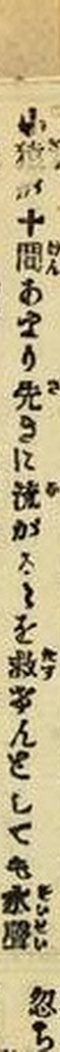小猿が十間あまり先きに流がるゝを救けんとしても水聲
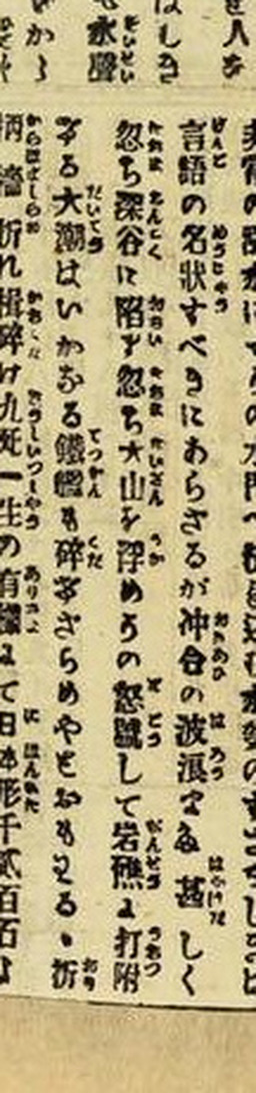忽ち深谷に陥り忽ち大山を浮めかの怒濤して岩礁に打附
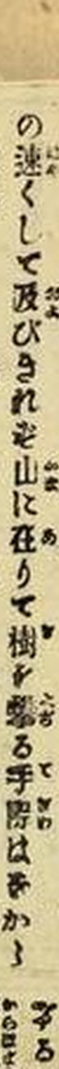の速くして及びきれず山に在りて樹を攀る手際はなかゝ
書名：温古集 五巻
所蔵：福井県文書館 Fukui Prefectural Archives
